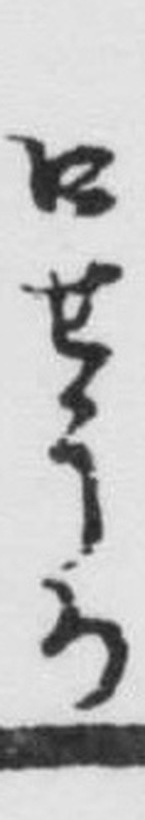口せうか
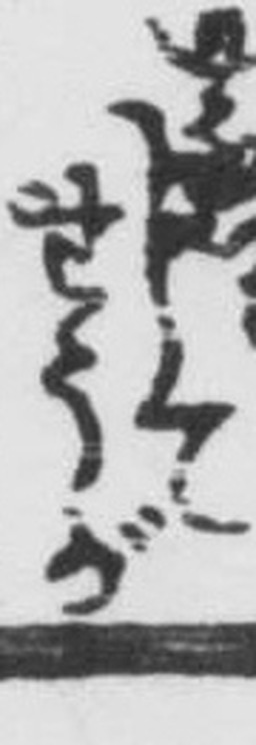せうが
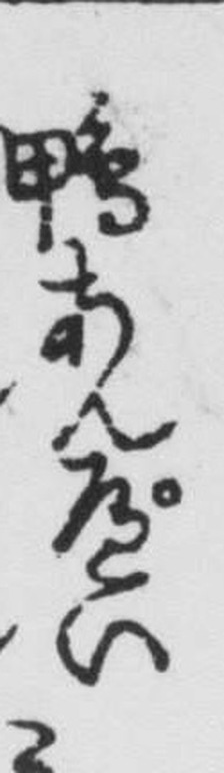鴨あんぺい
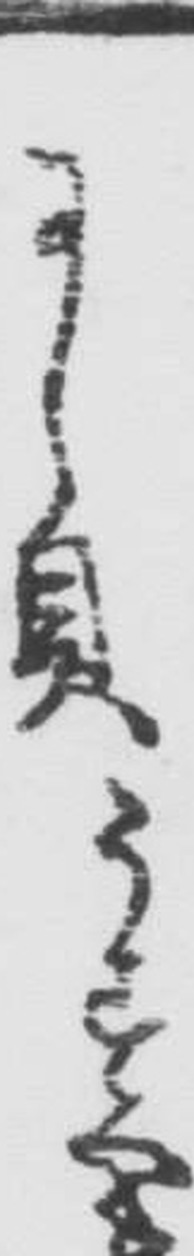にし貝うすへき
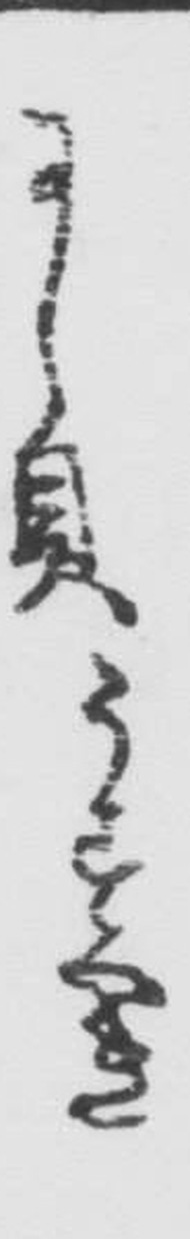にし貝うすへき
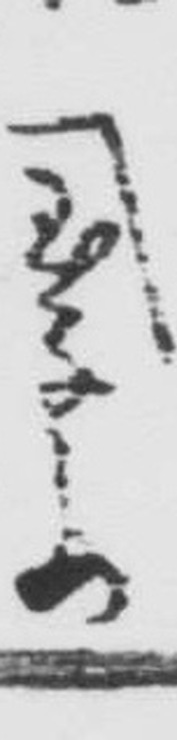〽玉子しめ
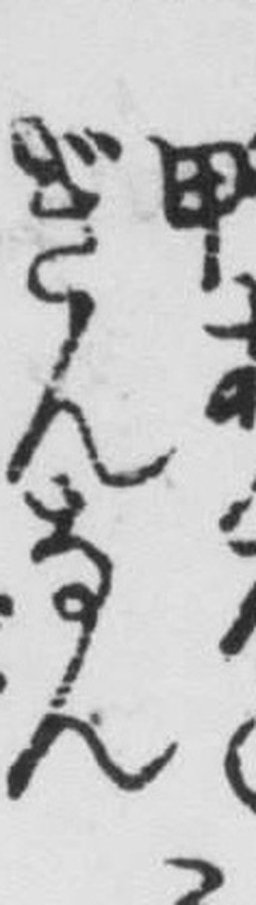ぎんなん
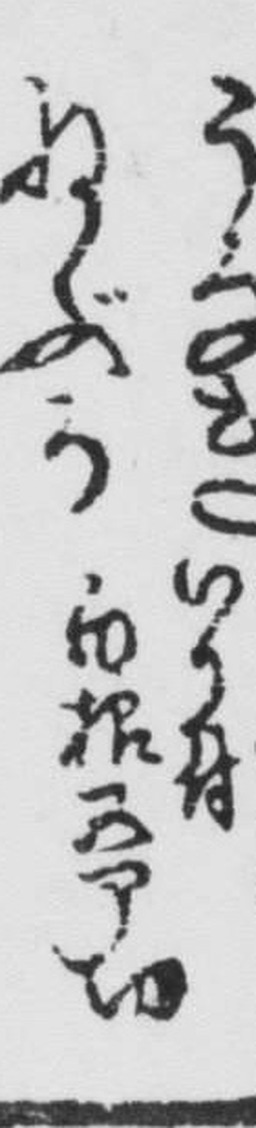ねぶか白根五部切
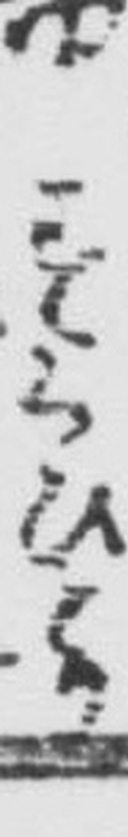すくひとり
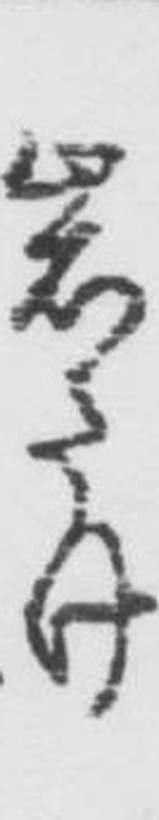岩たけ
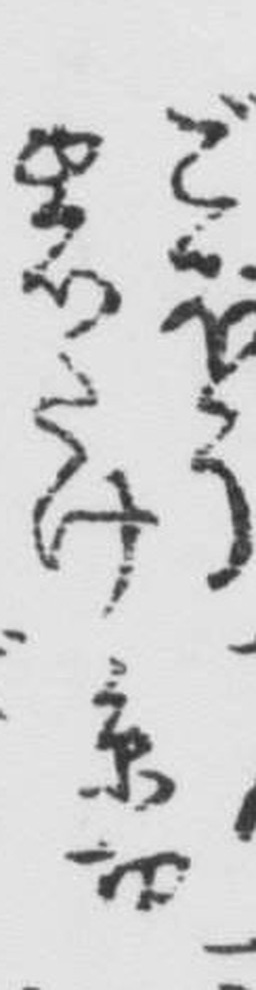岩たけ糸切
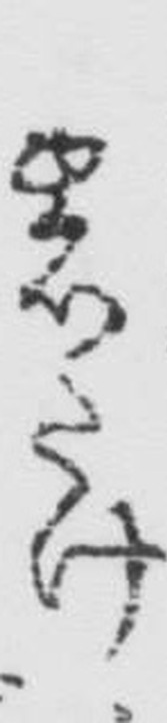岩たけ
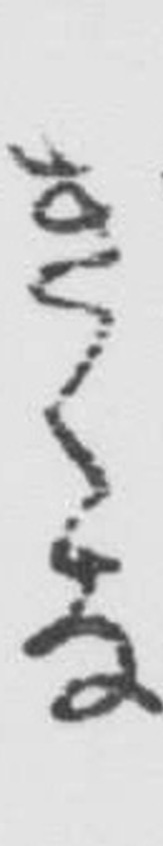きくな
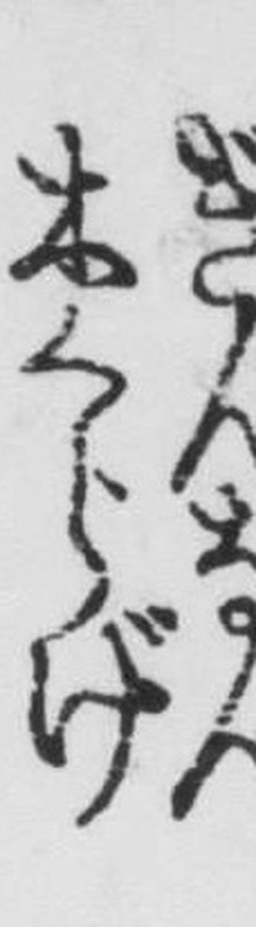木くらげ
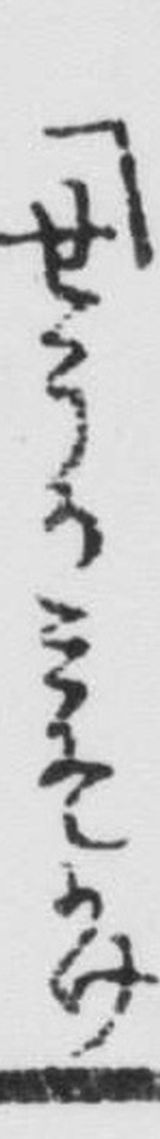〽せうあみそかけ
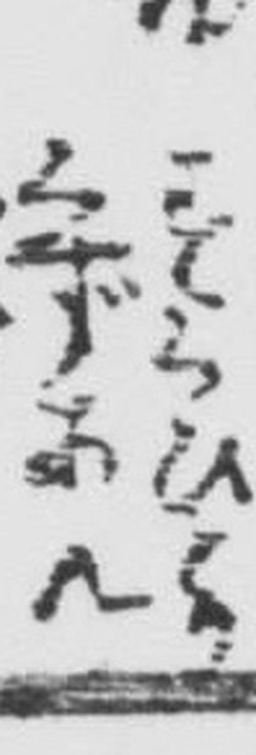くずあん
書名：諸家通用/即席料理
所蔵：大阪府立大学学術情報センター 国文学研究資料館
